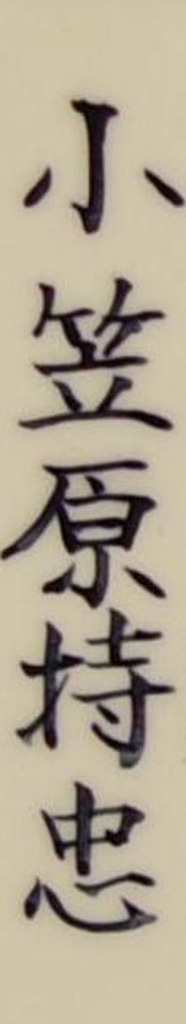小笠原持忠
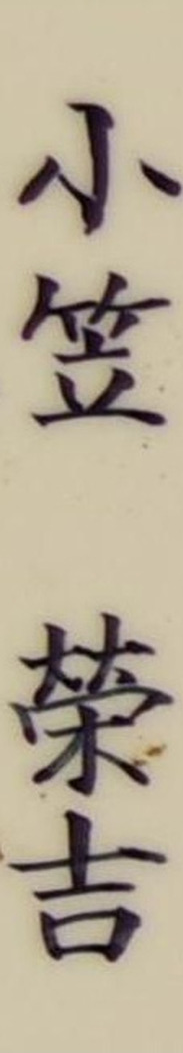小笠榮吉
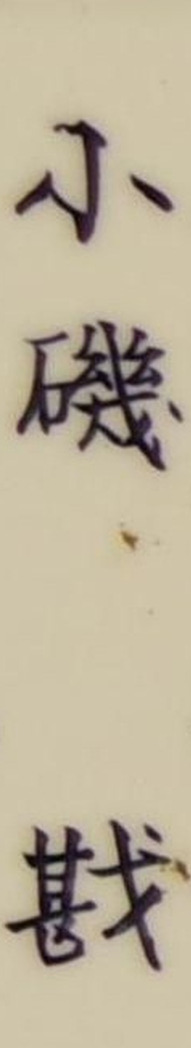小磯戡
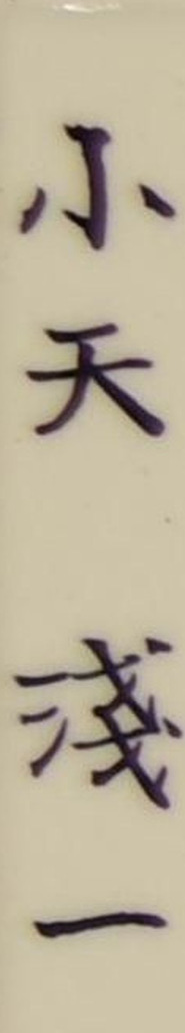小天浅一

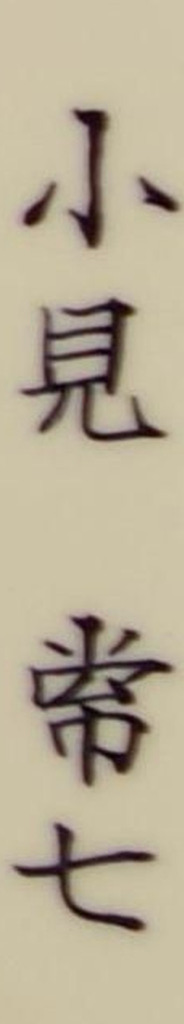小見常七
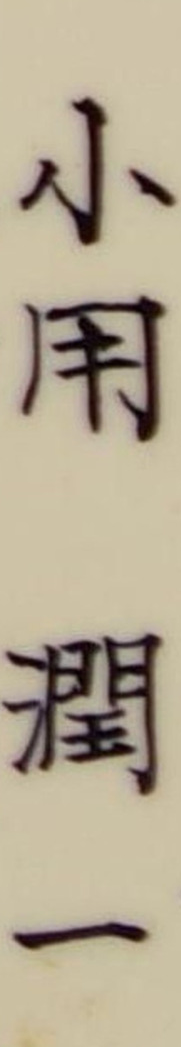小用潤一
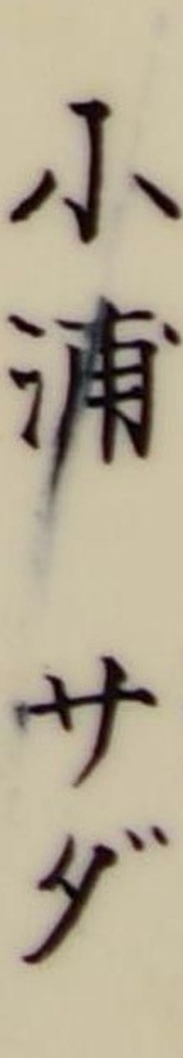小浦サダ
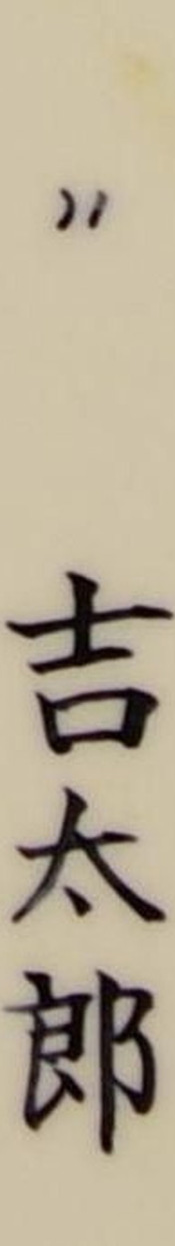吉太郎
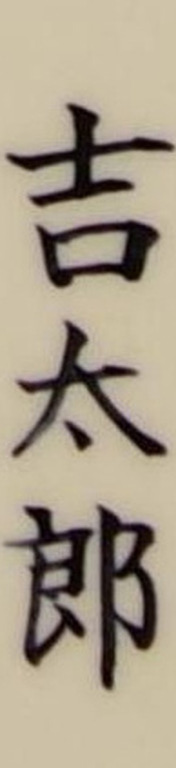吉太郎
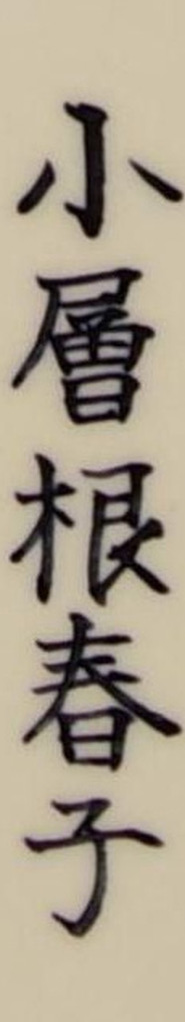小層根春子
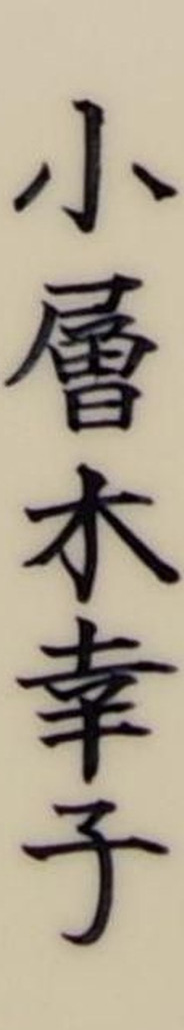小層木幸子
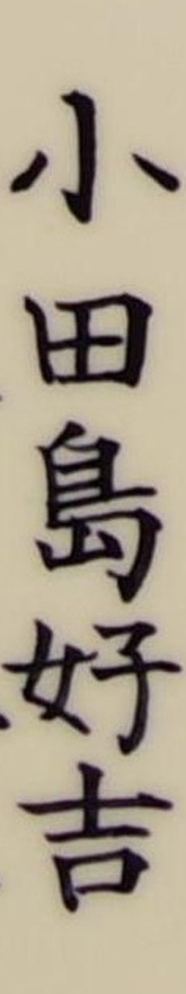小田島好吉
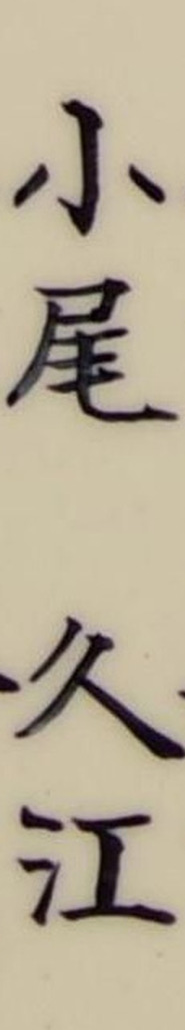小尾久江
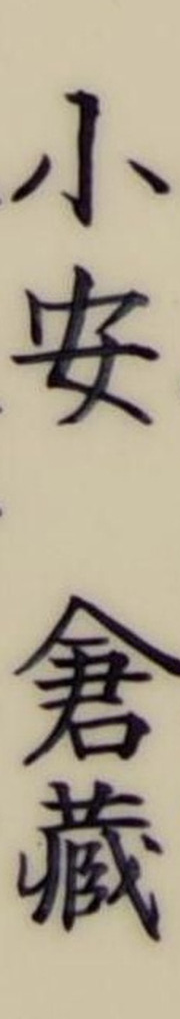小安倉蔵
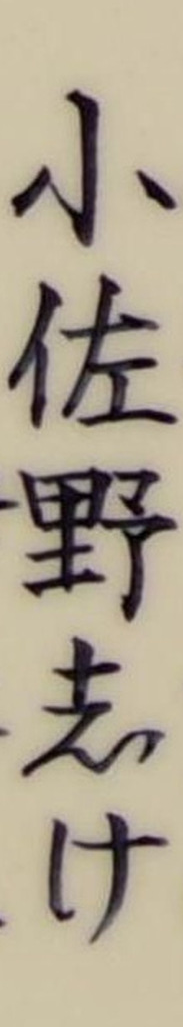小佐野しけ
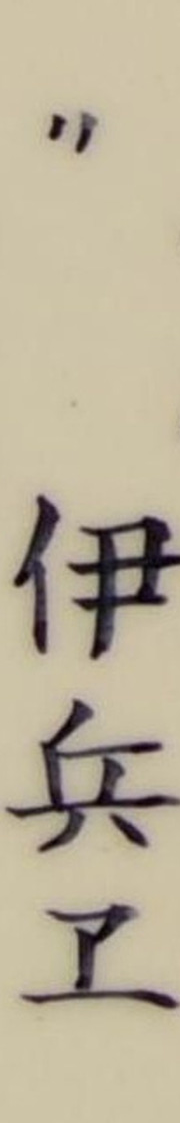伊兵エ
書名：E~L
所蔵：高野山金剛峯寺
